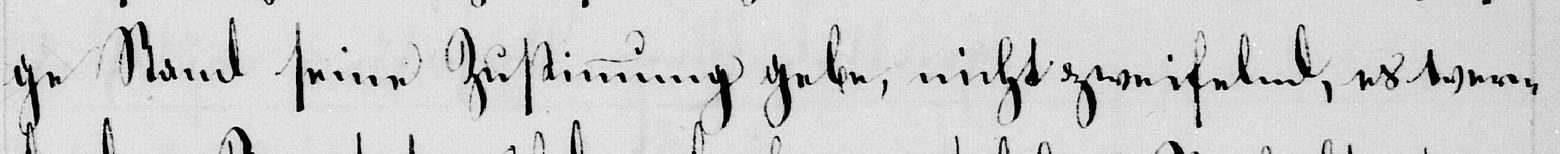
ge Stand seine Zustimmung gebe, nicht zweifelnd, es wer¬
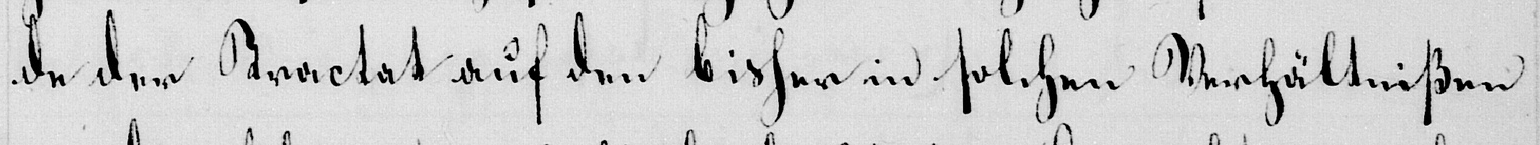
de der Tractat auf den bisher in solchen Verhältnißen
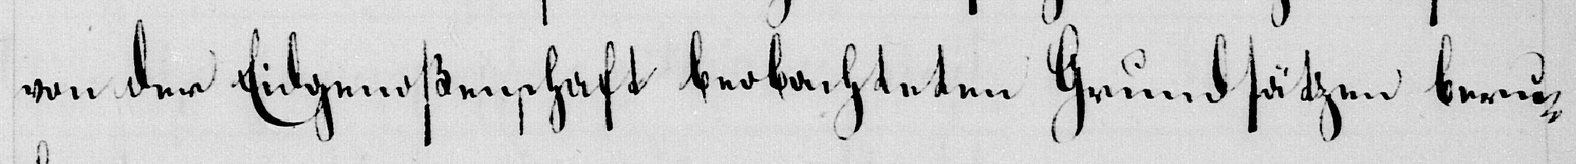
von der Eidgenoßenschaft beobachteten Grundsätzen beru¬
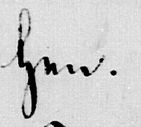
hen.
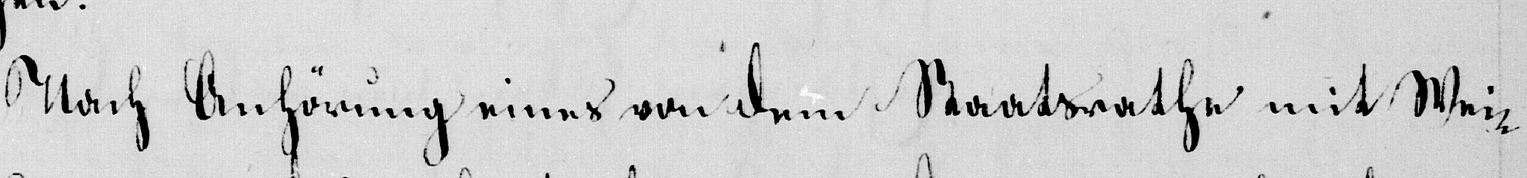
Nach Anhörung eines von dem Staatsrathe mit Wei¬
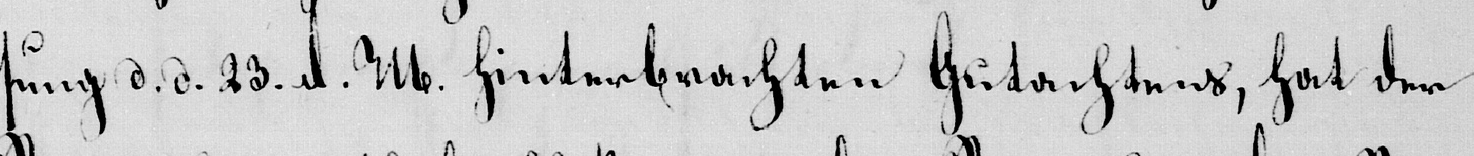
sung d. d. 23. d. M. hinterbrachten Gutachtens, hat der
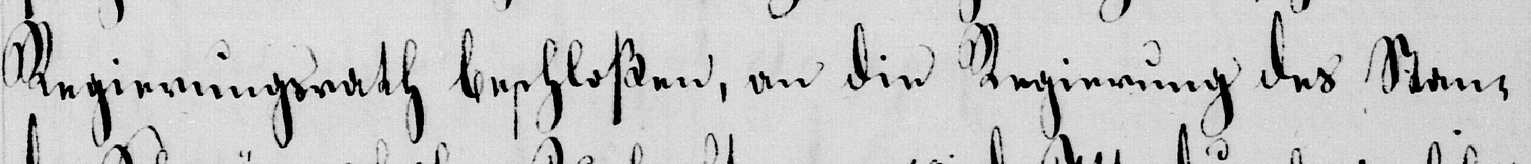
Regierungsrath beschloßen, an die Regierung des Stan¬
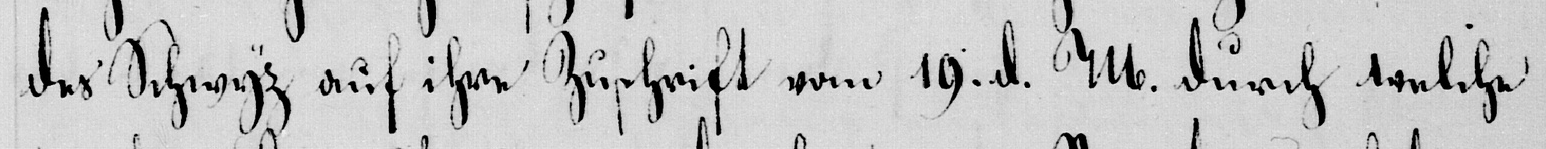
des Schwyz auf ihre Zuschrift vom 19. d. M. durch welche
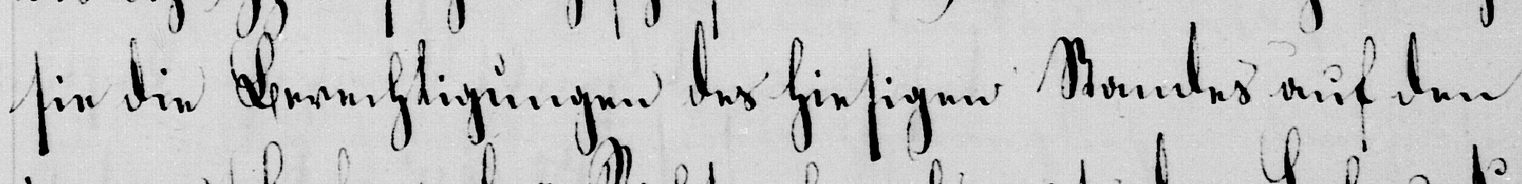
sie die Berechtigungen des hiesigen Standes auf den
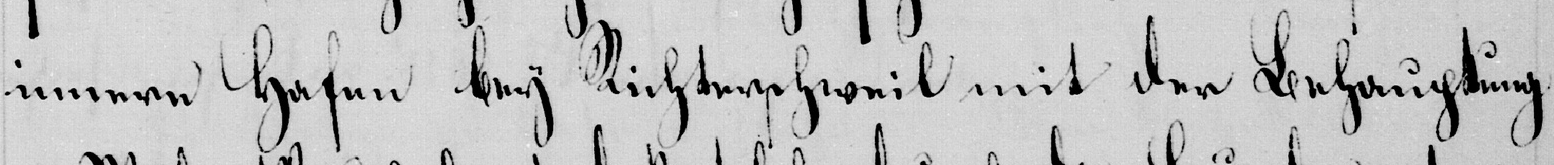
innern Hafen bey Richterschweil mit der Behauptung
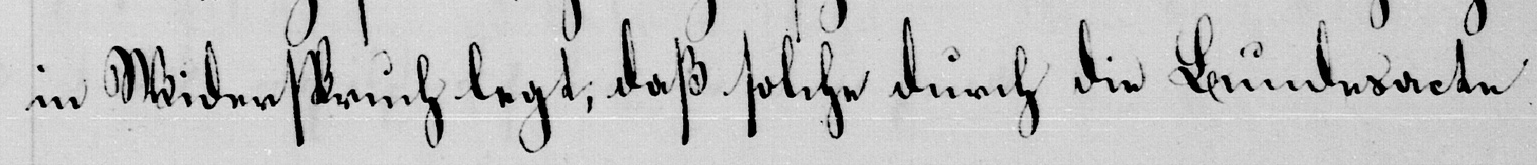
in Widerspruch legt, daß solche durch die Bundesacte
